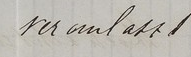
veranlasst
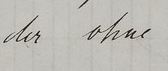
aber frei-
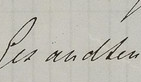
lich auch ohne
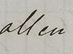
werde die
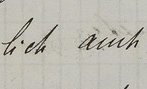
mit einem
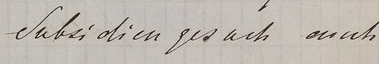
Subsidiengesuch auch
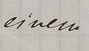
an Würtemberg
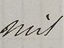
gelangen.
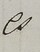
ich
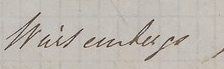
Würtembergs
